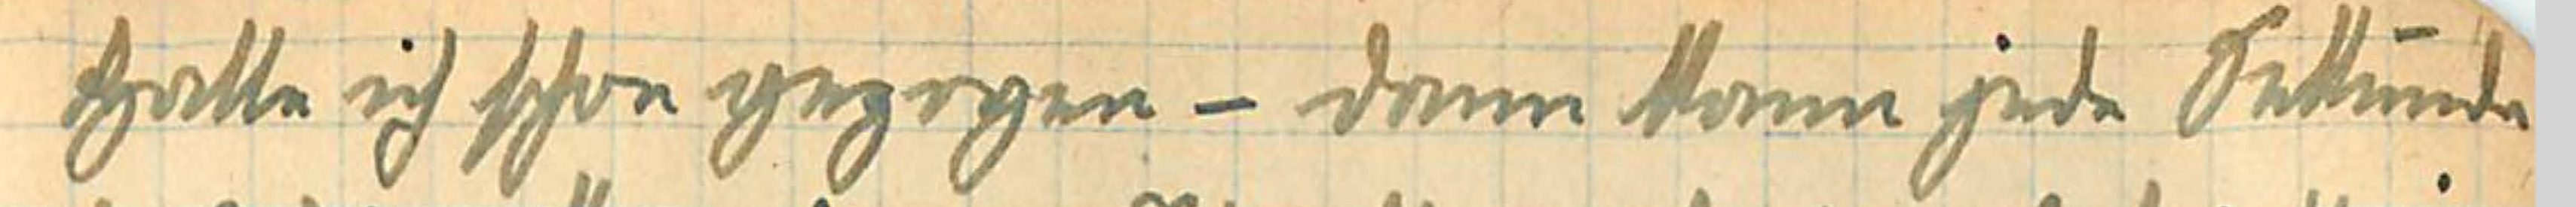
Hatte ich schon gezogen – dann kann jede Sekunde
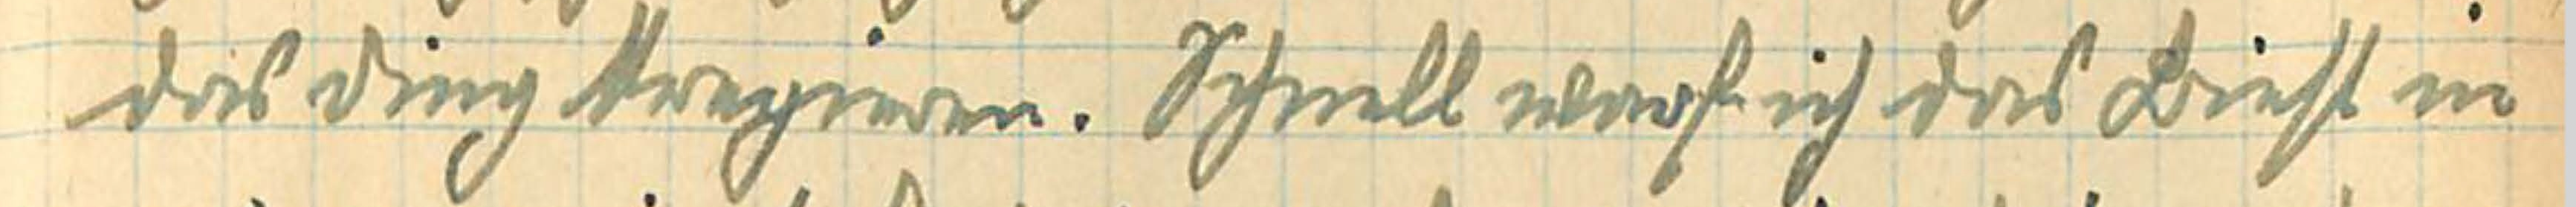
das Ding krepieren. Schnell warf ich das Biest in
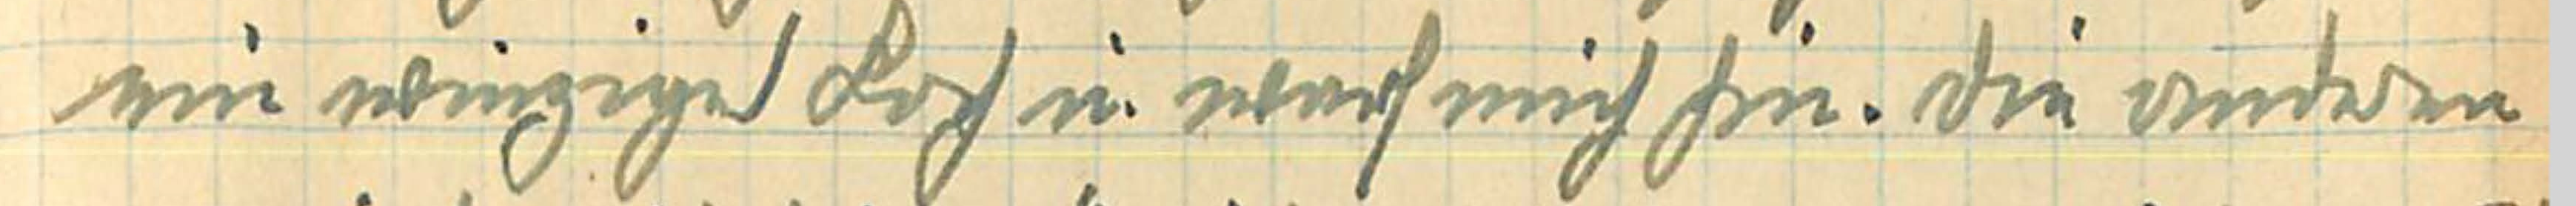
ein winziges Loch u. warf mich hin. Die anderen
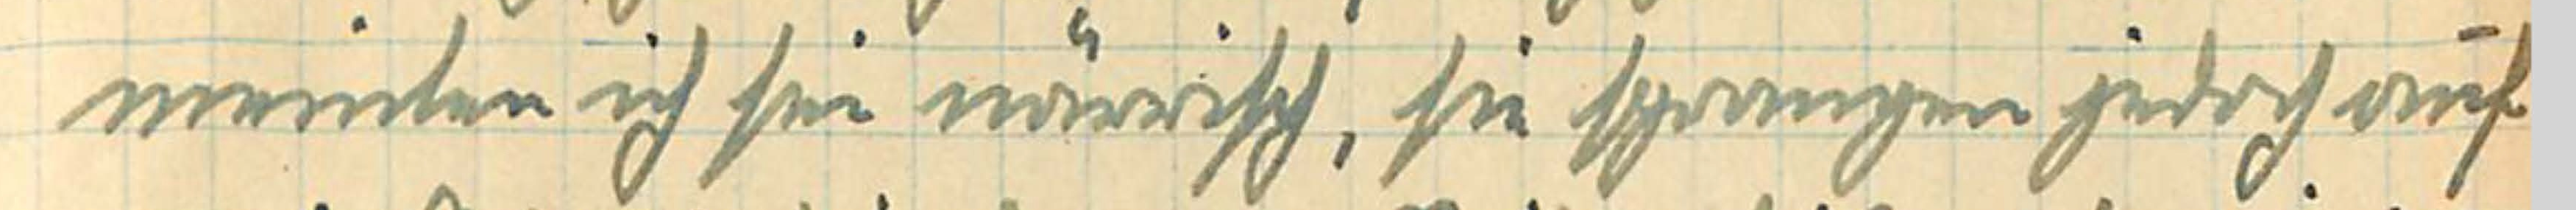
meinten ich sei närrisch, sie sprangen jedoch auf
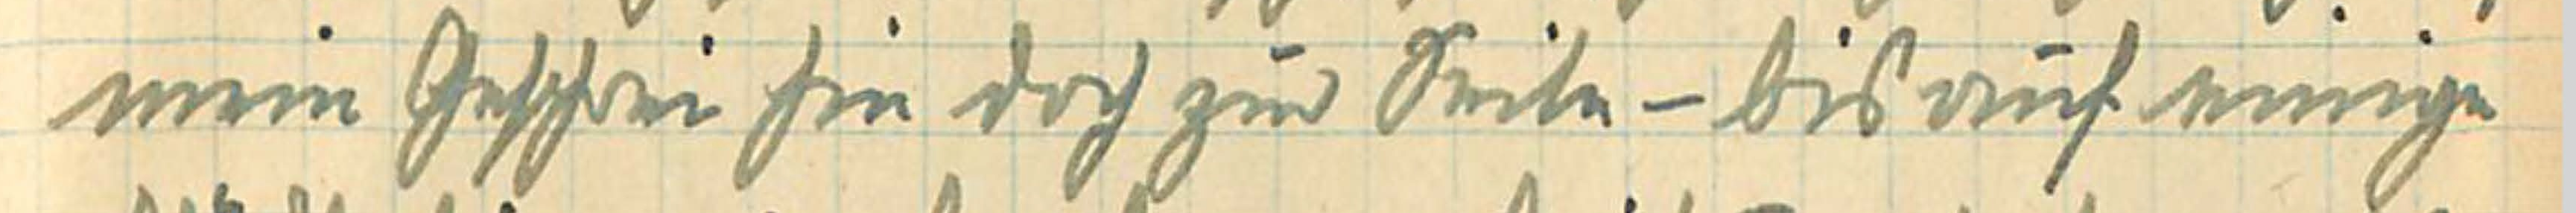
mein Geschrei hin doch zur Seite – bis auf einige
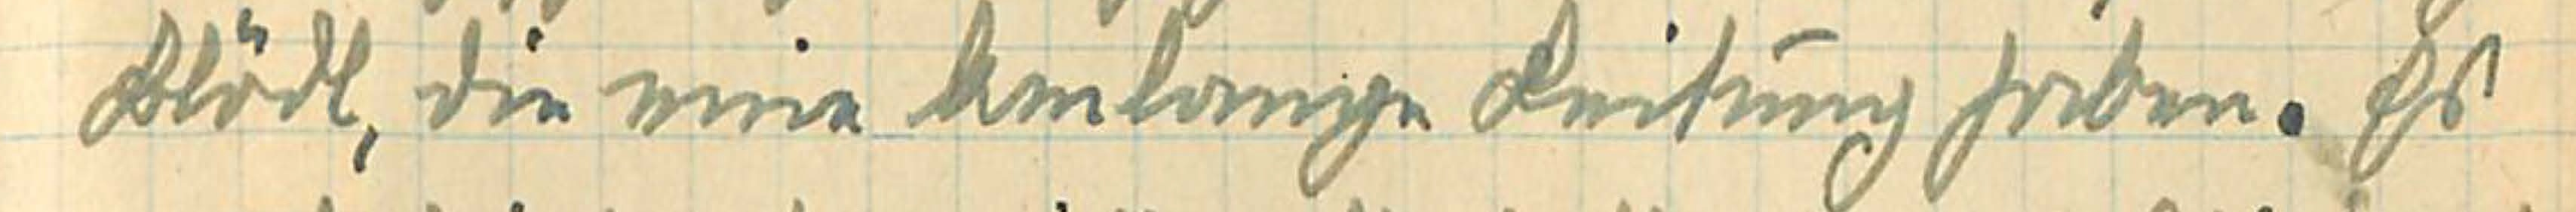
Blödl, die eine kmlange Leitung haben. Es
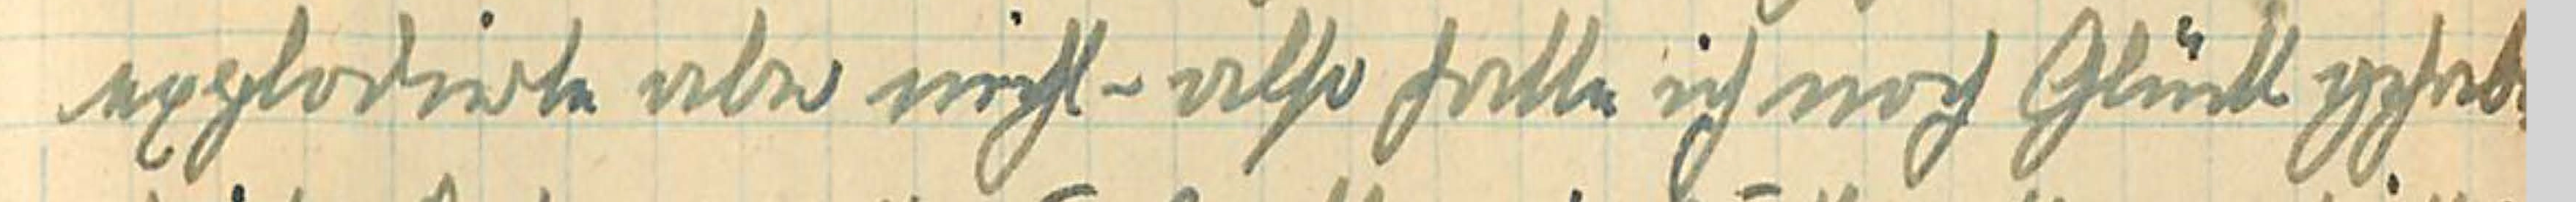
explodierte aber nicht – also hatte ich noch Glück gehabt.
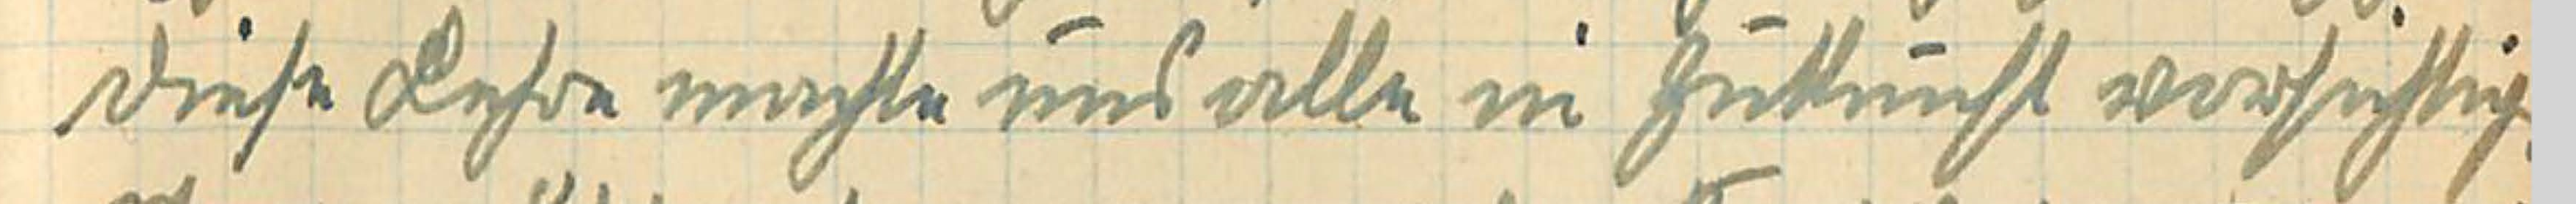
Diese Lehre machte uns alle in Zukunft vorsichtig.
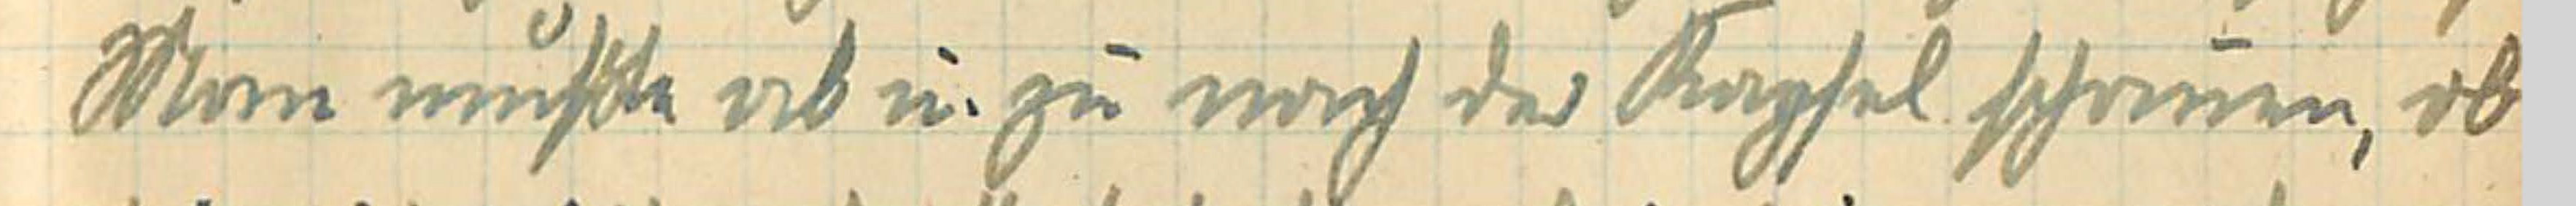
Man mußte ab u. zu nach der Kapsel schauen, ob
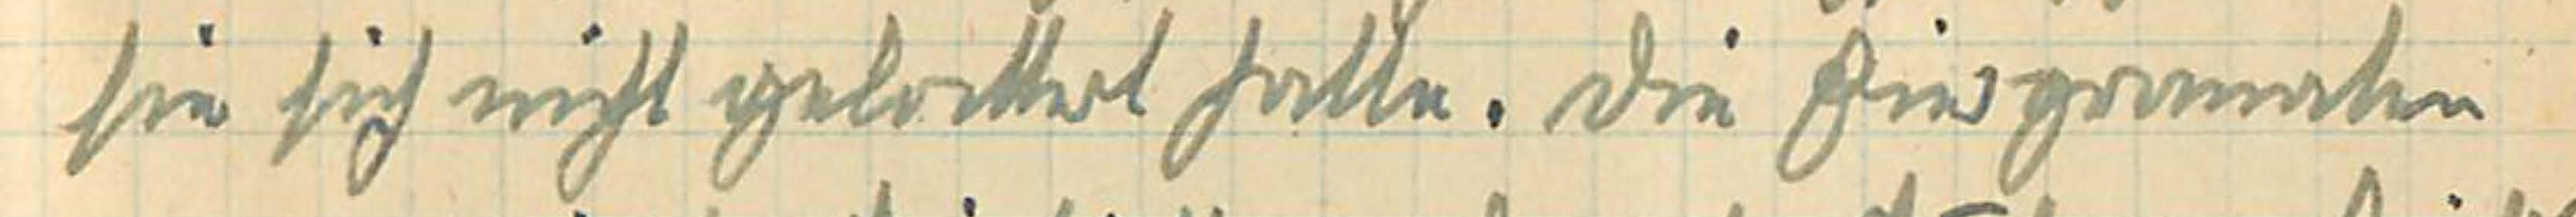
sie sich nicht gelockert hatte. Die Eiergranaten
